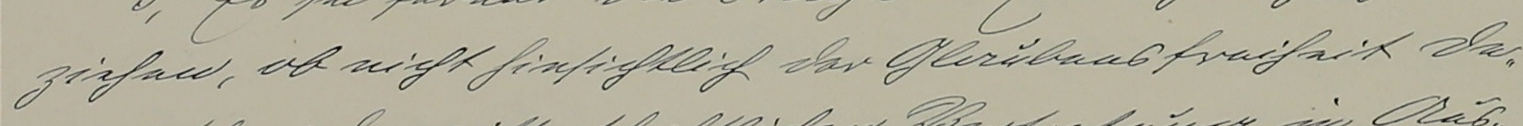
ziehen, ob nicht hinsichtlich der Glaubensfreiheit De-
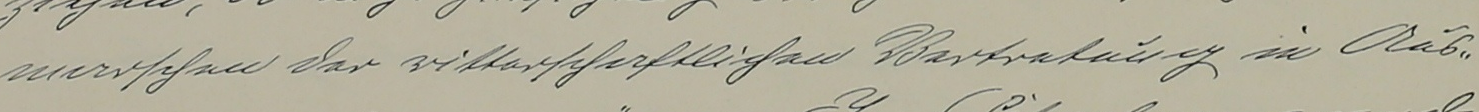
marschen der ritterschaftlichen Vertretung in Aus-
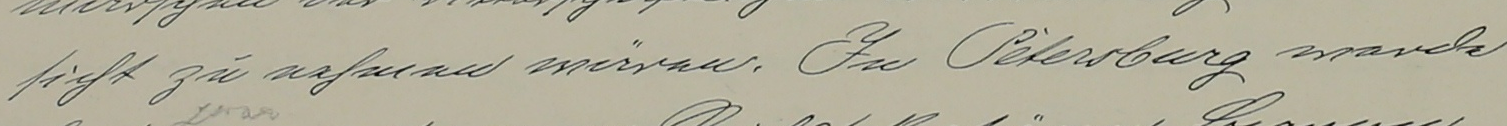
sicht zu nehmen wären. In Petersburg werde
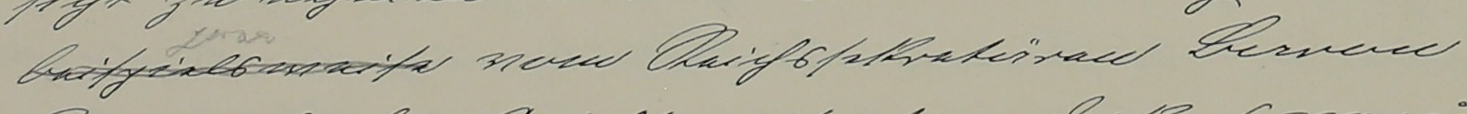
beispielsweise vom Reichssekretären Baron
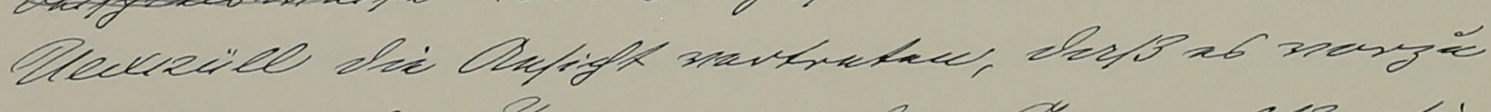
Uexküll die Ansicht vertreten, daß es vorzu
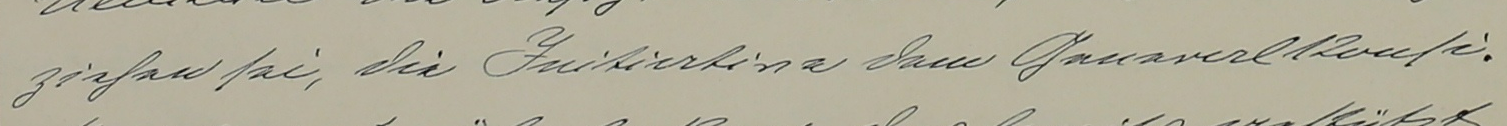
ziehen sei, die Initiative dem Generalkonsi-
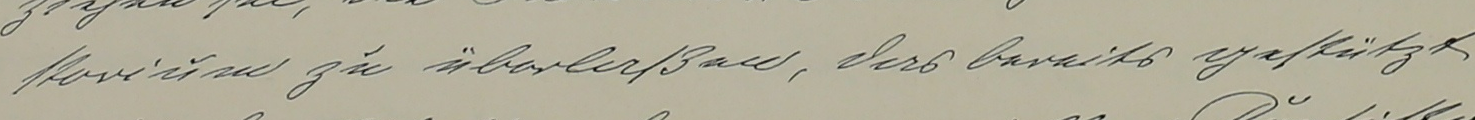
storium zu überlaßen, das bereits gestützt
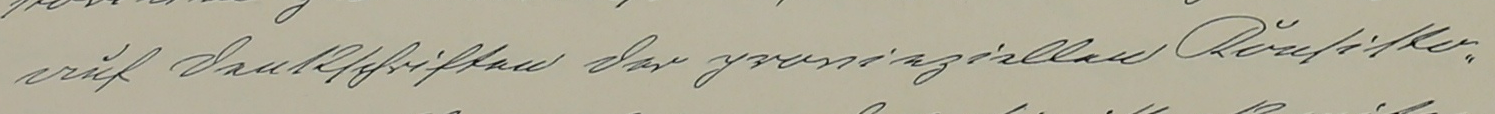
auf Denkschriften der provinziellen Konsisto-
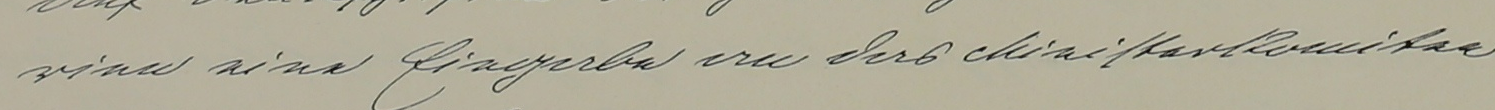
rien, eine Eingabe an das Ministerkomitee
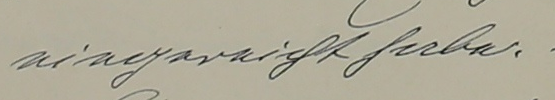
eingereicht habe.
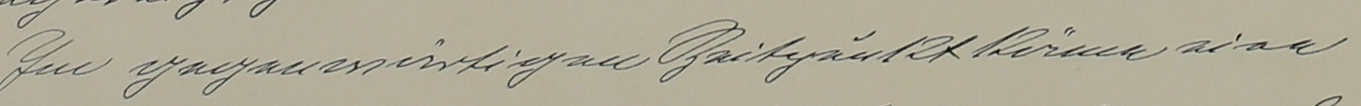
Im gegenwärtigen Zeitpunkt käme eine
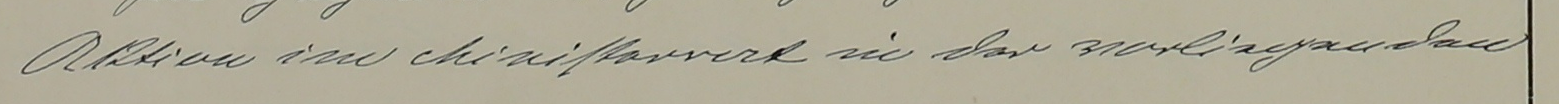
Aktion im Ministerrat in der vorliegenden
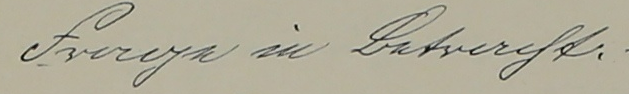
Frage in Betracht.
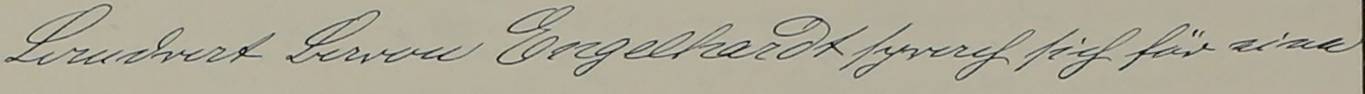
Landrat Baron Engelhardt sprach sich für eine
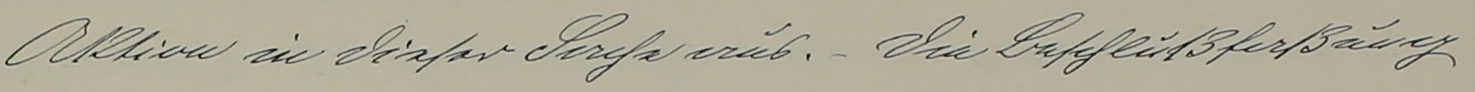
Aktion in dieser Sache aus. - Die Beschlußfaßung
